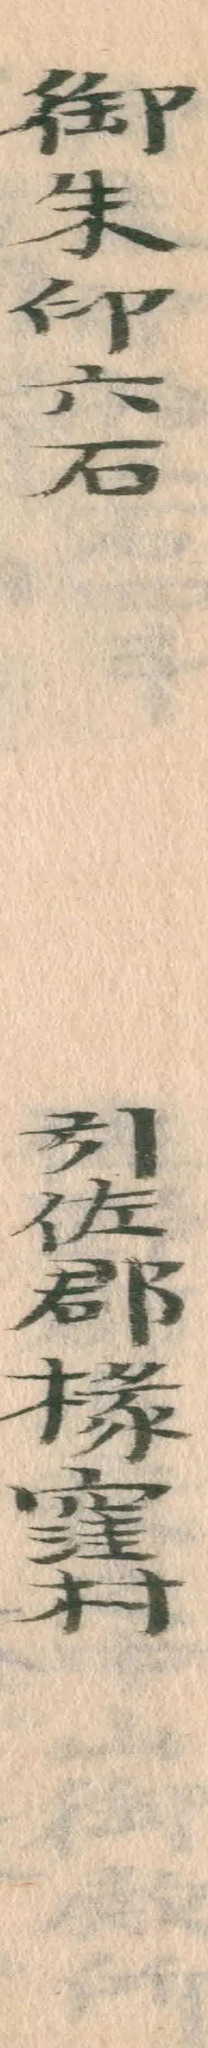御朱印六石引佐郡掾窪村
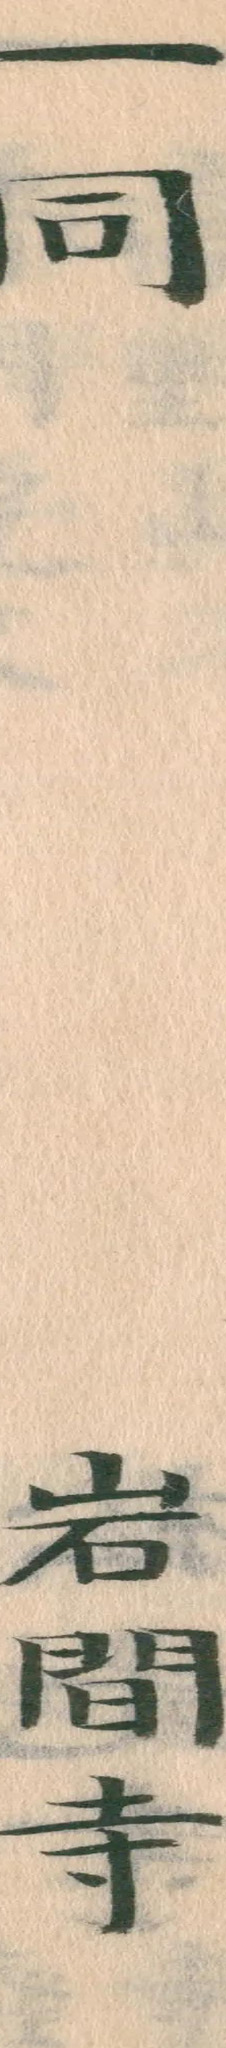一同岩間寺
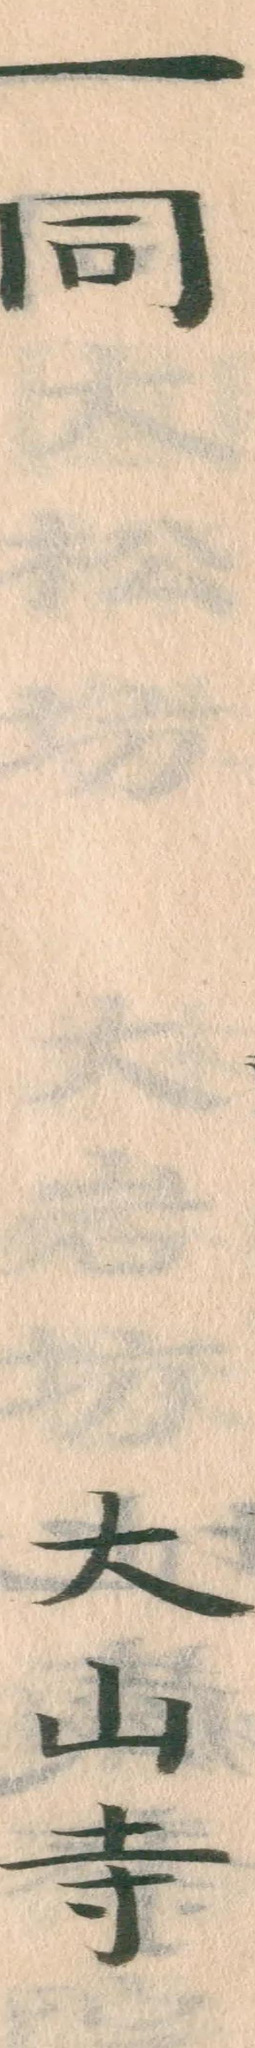一同大山寺
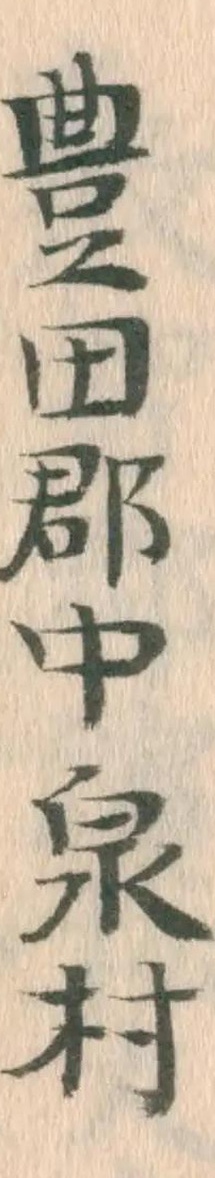豊田郡中泉村

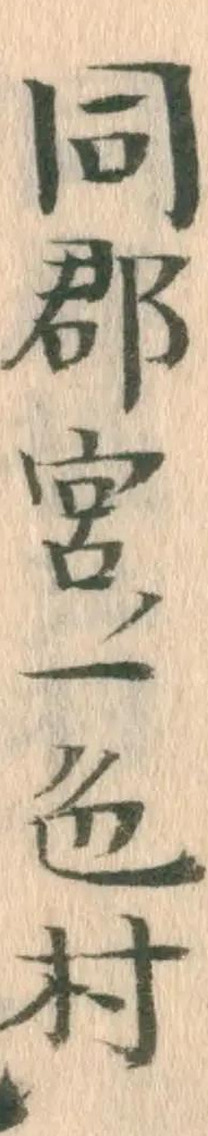同郡宮ノ一色村
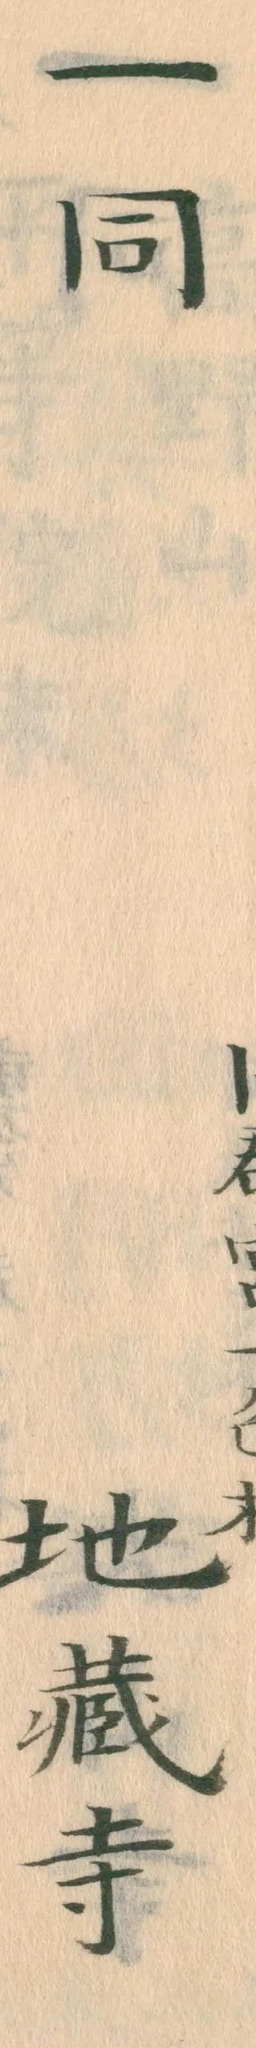一同地蔵寺
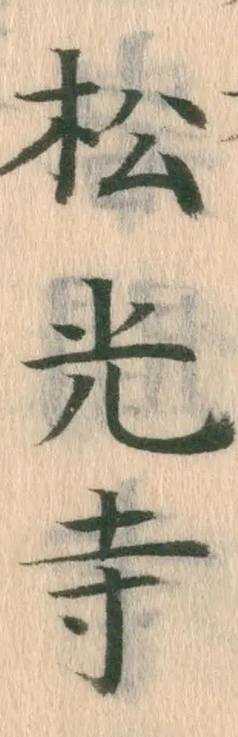松光寺
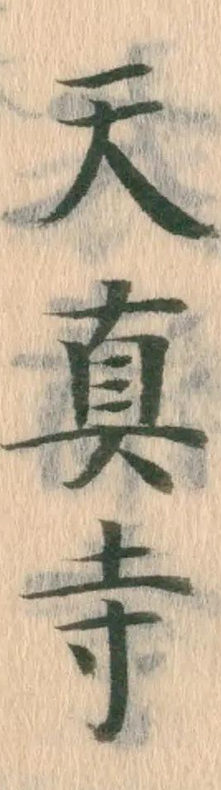夭真寺
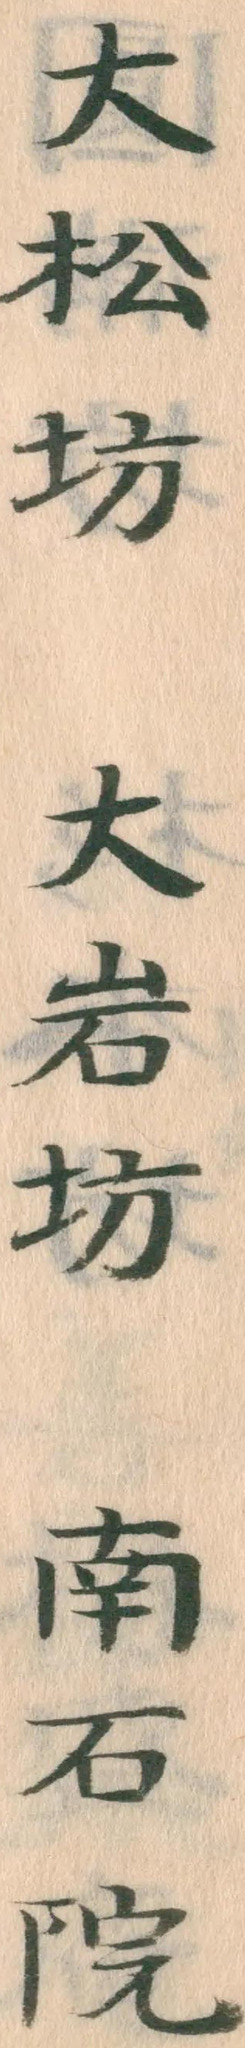大松坊大岩坊南石院

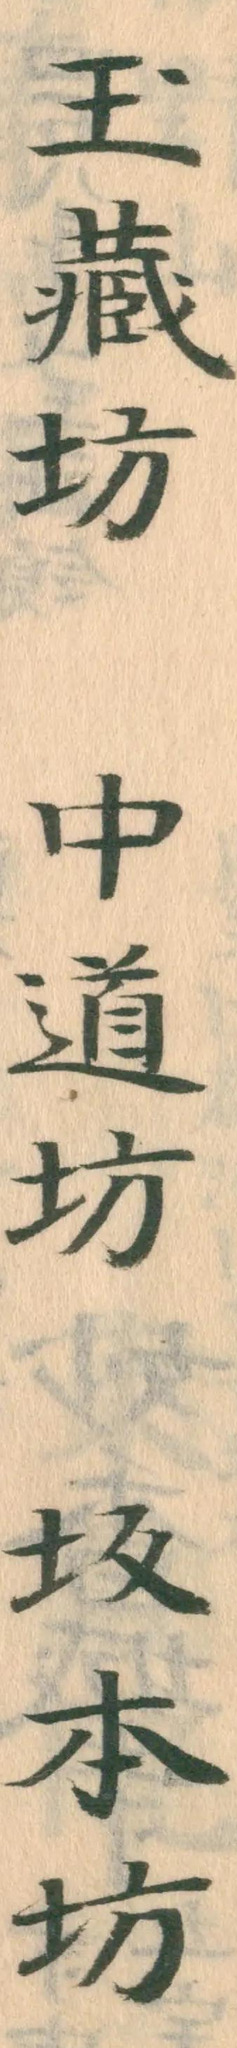玉蔵坊中道坊坂本坊
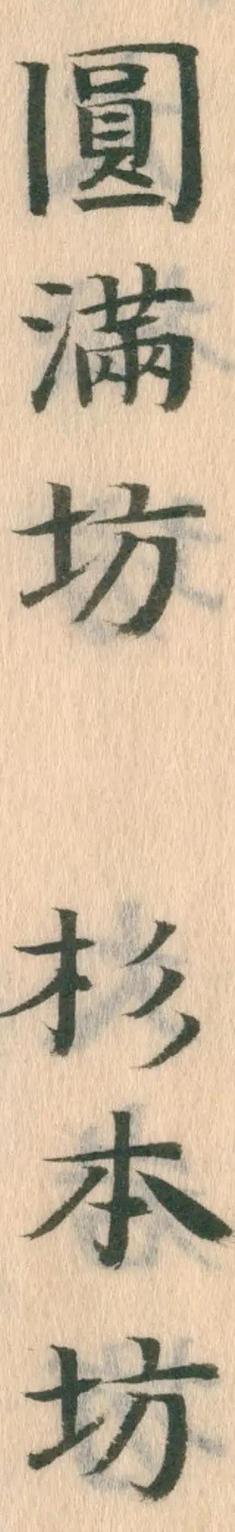円満坊杉本坊
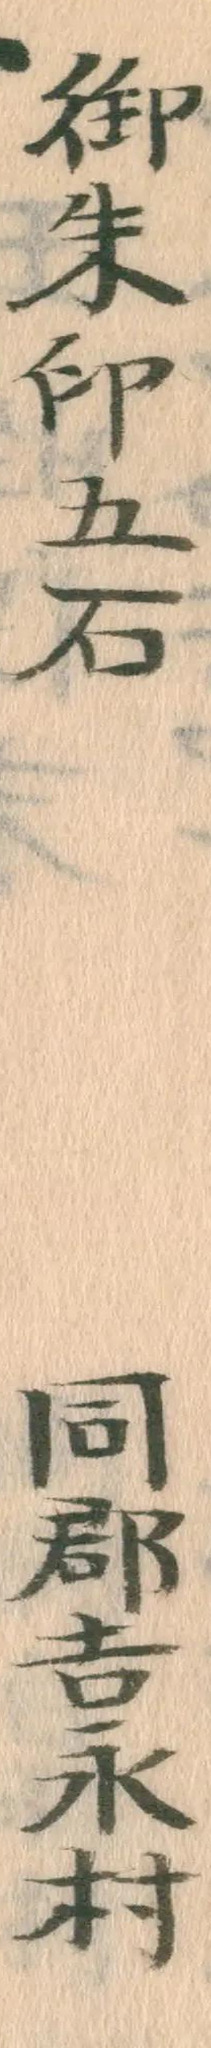御朱印五石同郡吉永村
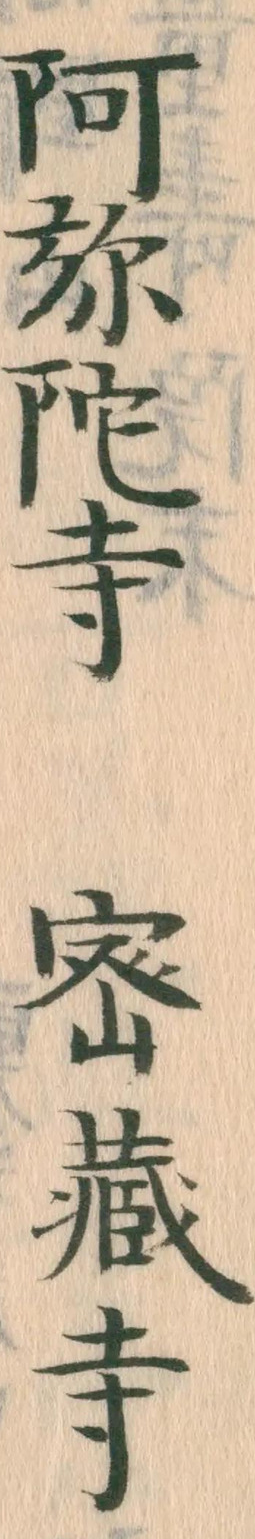阿弥陀寺密蔵寺
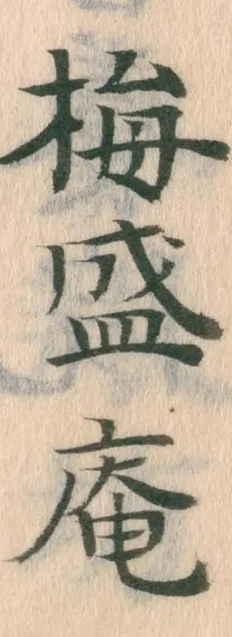梅盛庵
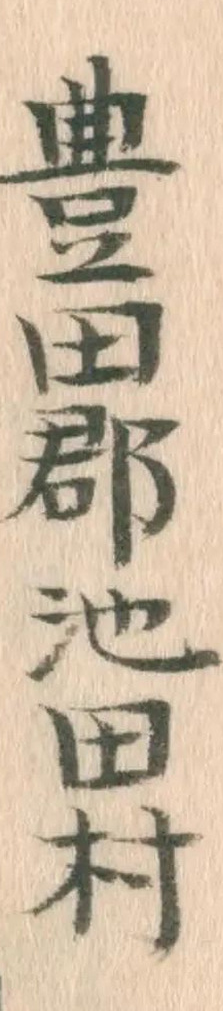豊田郡池田村

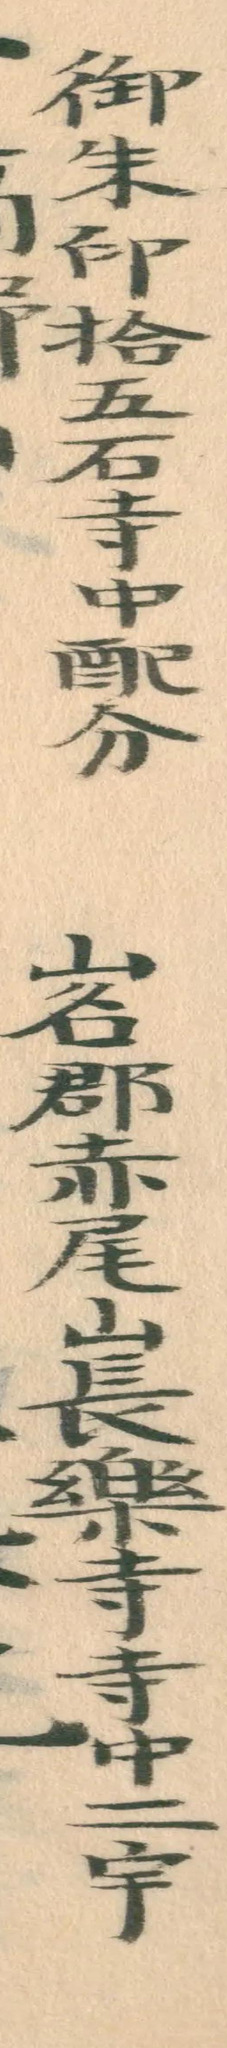御朱印拾五石寺中配分山名郡赤尾山長楽寺寺中二宇
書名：古義真言宗本末帳 21巻. [4] 第三 伊賀国、伊勢国、志摩国、尾張国、三河国、遠江国、駿河国、伊豆国、甲斐国
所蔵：国立国会図書館 National Diet Library, JAPAN
